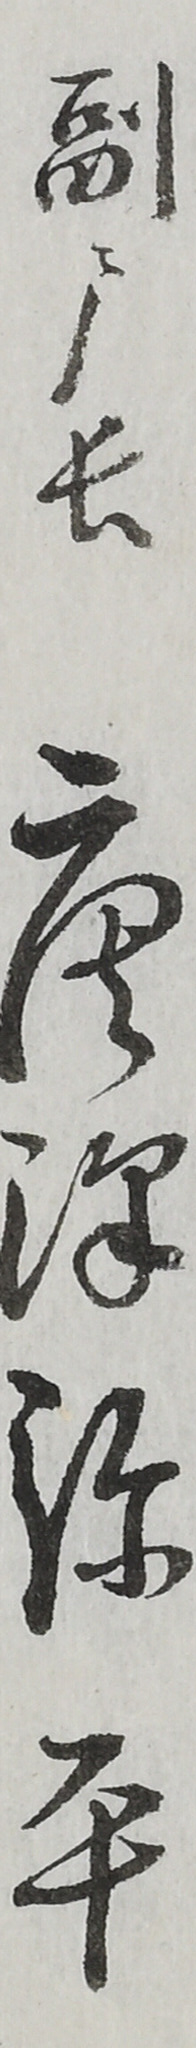福戸長唐澤弥平
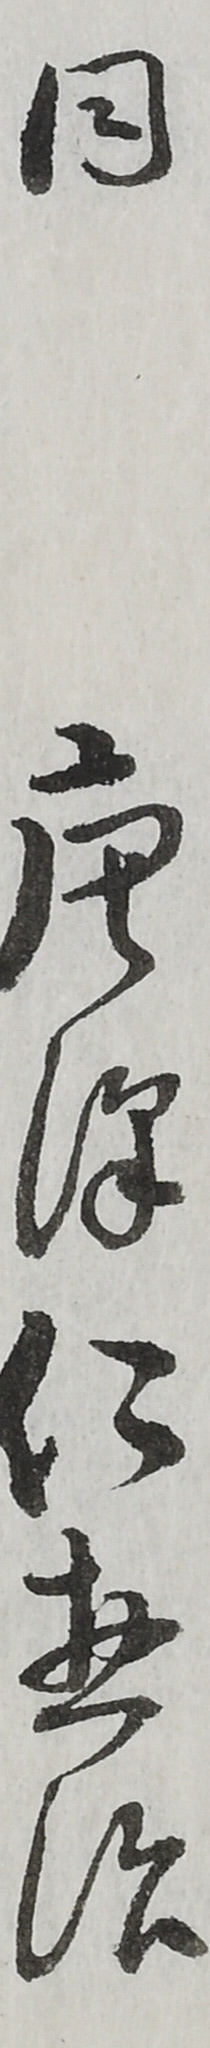同唐澤仁惣治
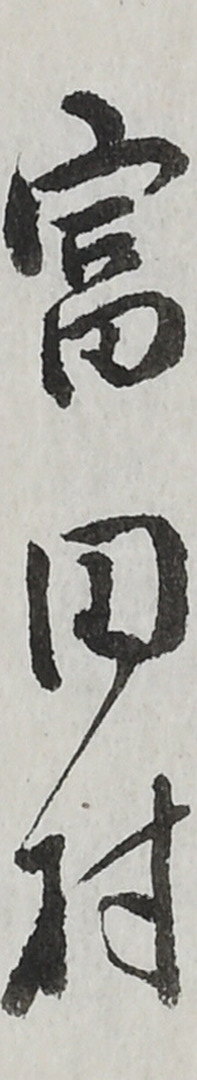富田村
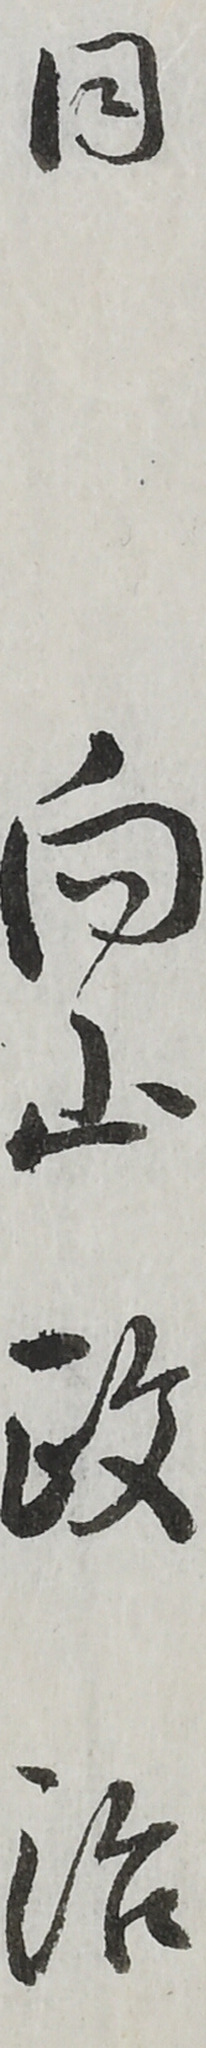同向山政治
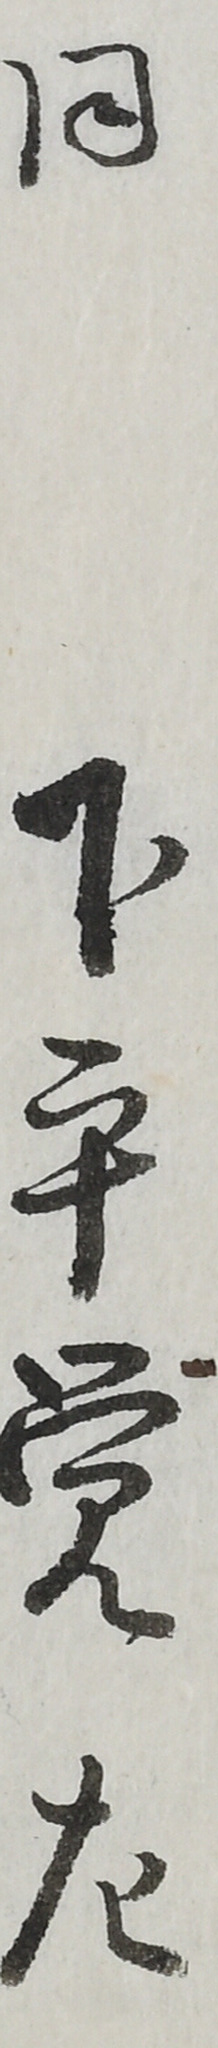同下平覚左
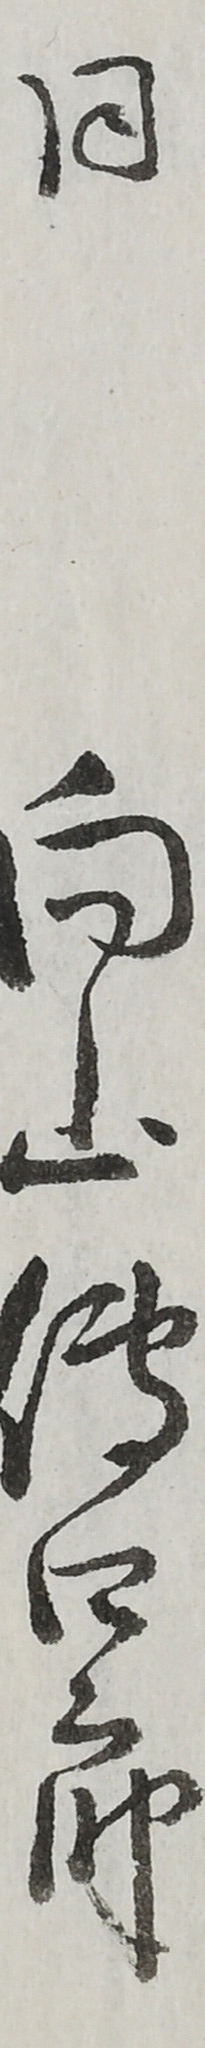同向山伝四郎
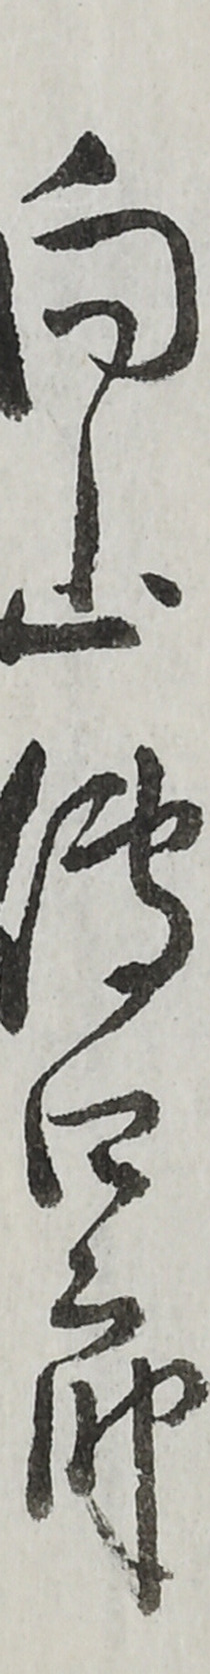同向山伝四郎
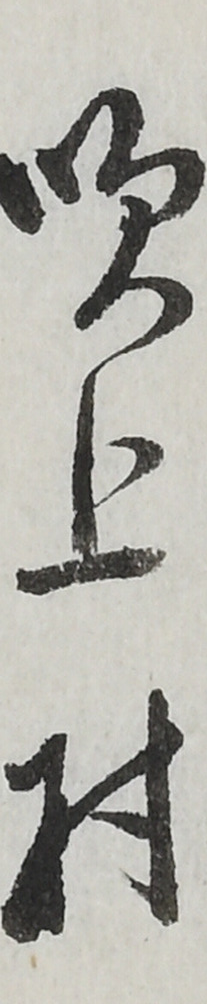吹上村

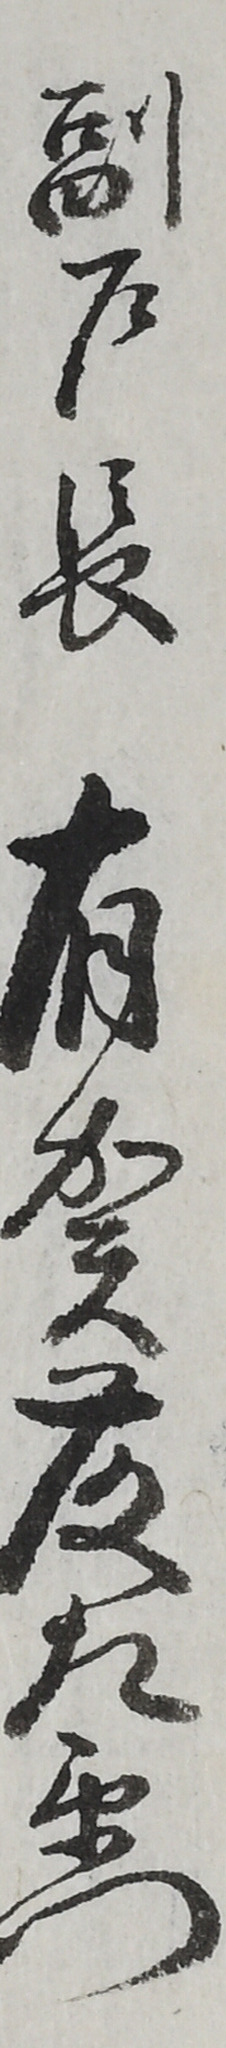副戸長有賀藤左衛門
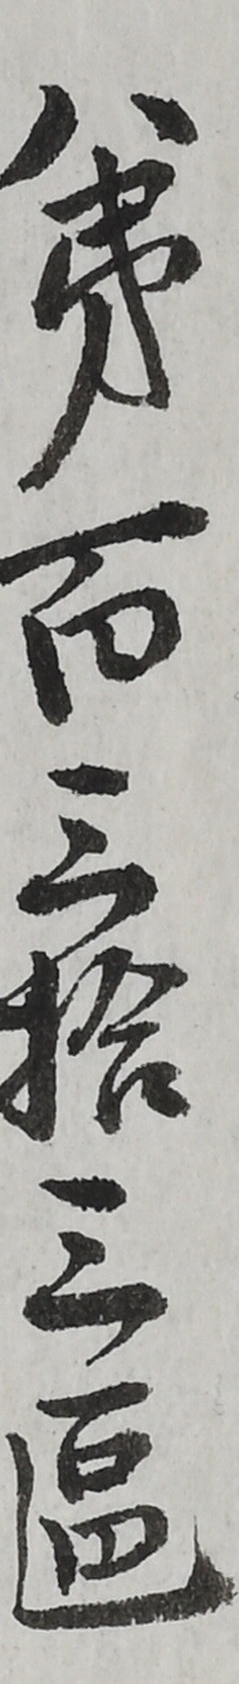第百三拾三区
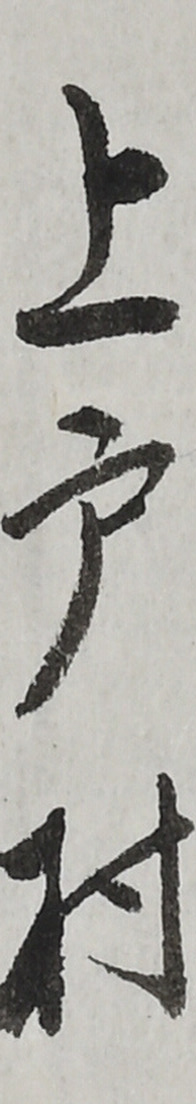上戸村
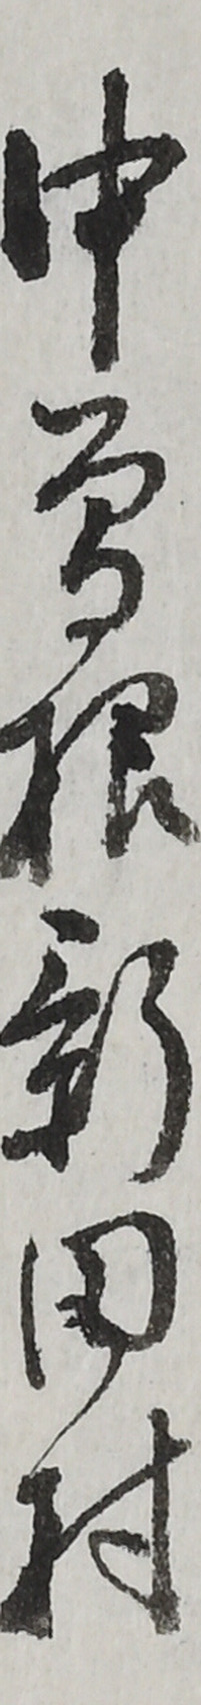中曽根新田村
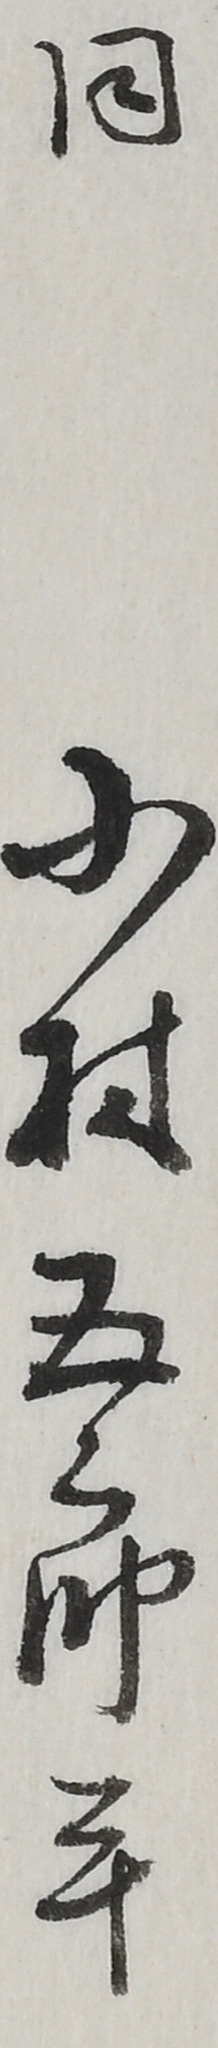同小林五郎平
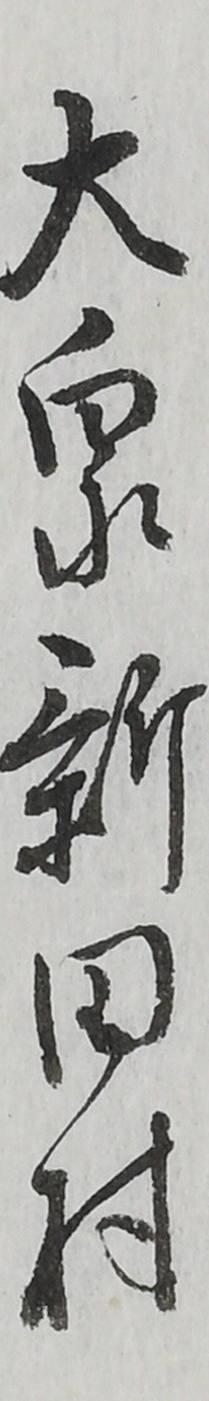大泉新田村
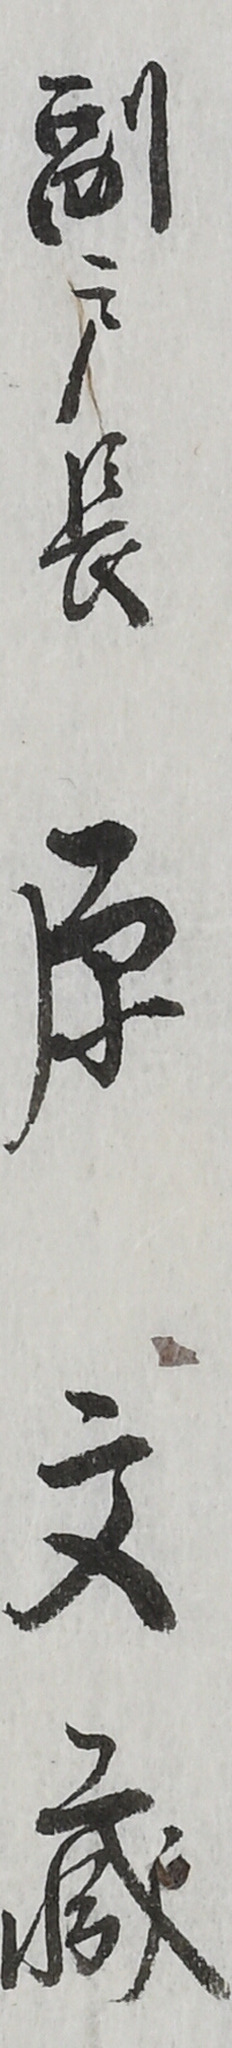副戸長原文蔵
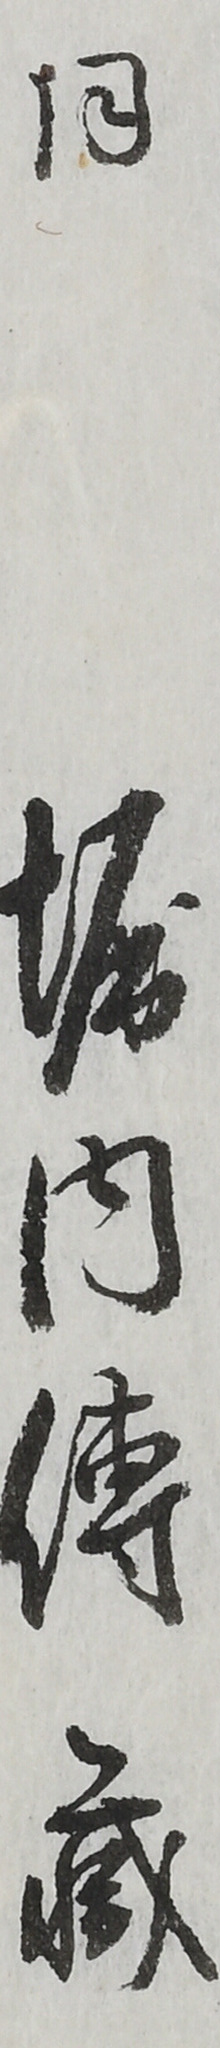同堀内伝蔵
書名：伊那郡毎村戸長副戸長名簿
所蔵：伊那市立高遠町図書館・合同会社AMANE
